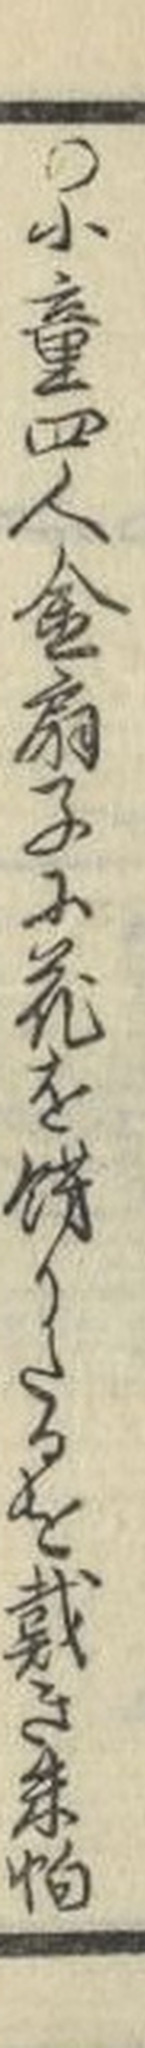○小童四人金扇子に花を錺りたるを戴き朱帕
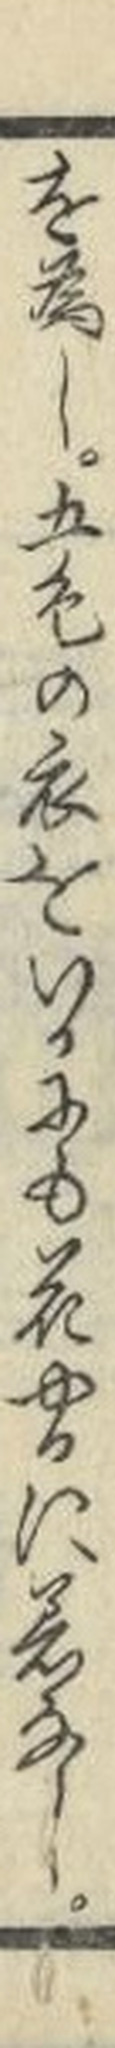を為し。五色の衣をいかにも花やかに着なし。
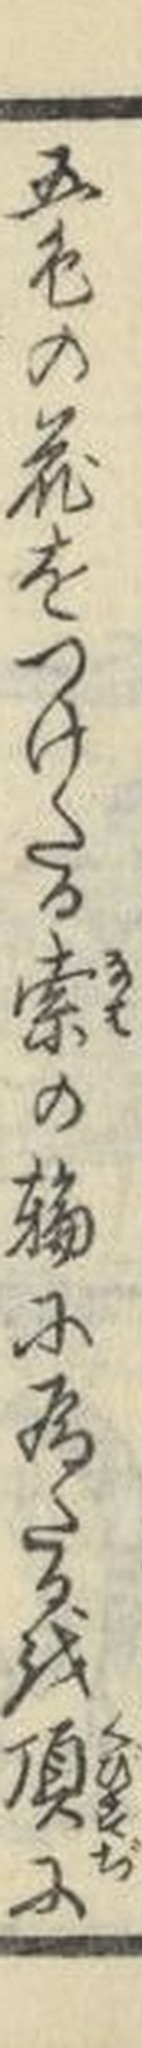五色の花をつけたる索の輪に為たるを頂に
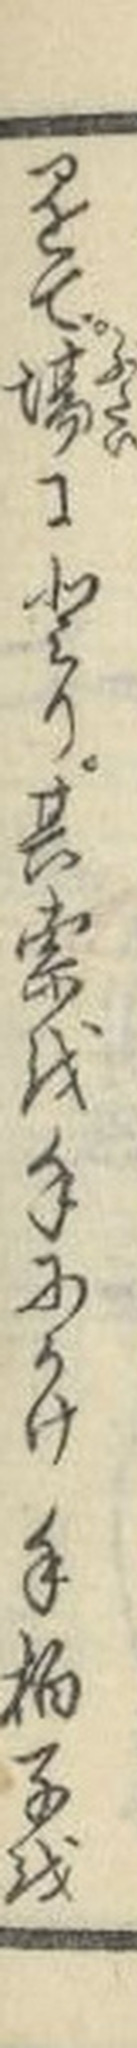置て。場に登り。其索を手にかけ手拍子を
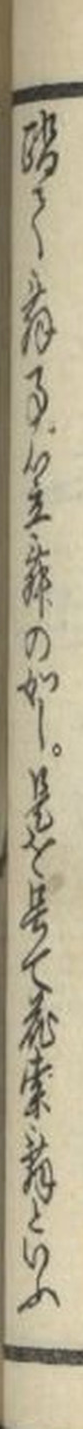鳴て舞事。笠舞の如し。是を号て花索舞といふ
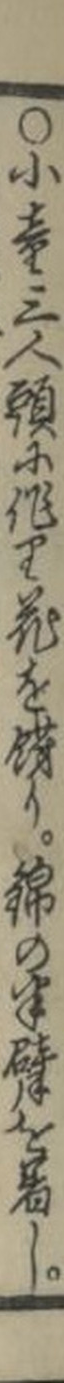○小童三人頭に作り花を錺り。綿の半臂を着し。
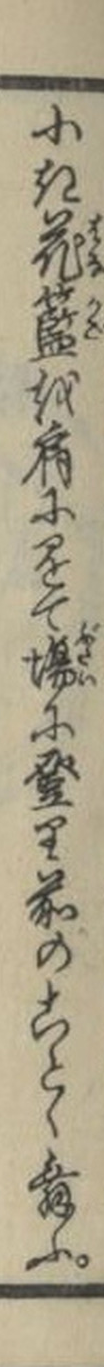小き花籃を肩に置て場に登り前のことく舞ふ。
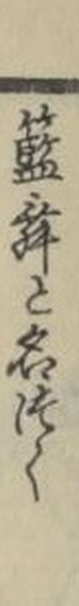籃舞と名つく
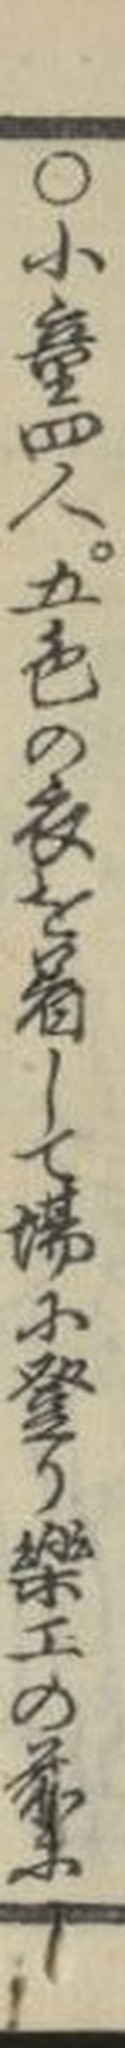○小童四人。五色の衣を着して場に登り楽工の前に
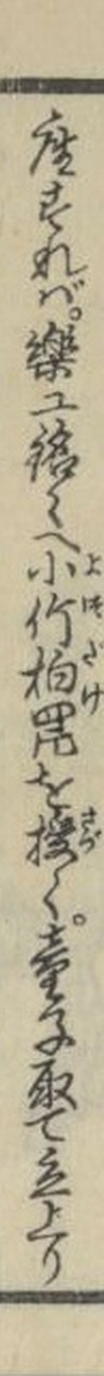座すれば。楽工語て小竹拍片を援く。童子取て立上り
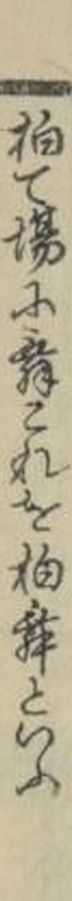拍て場に舞これを拍舞といふ
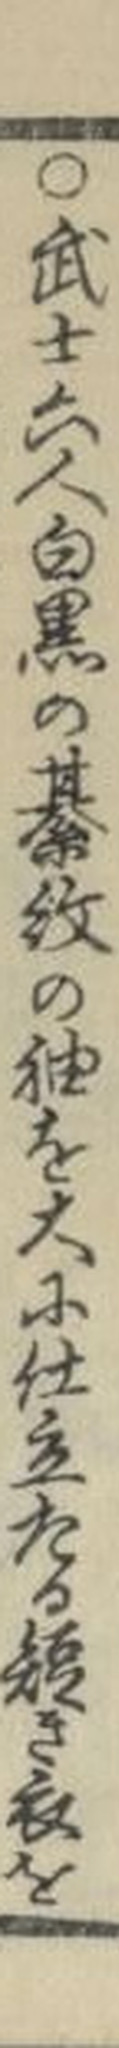○武士六人白黒の綦紋の袖を大に仕立たる短き衣を
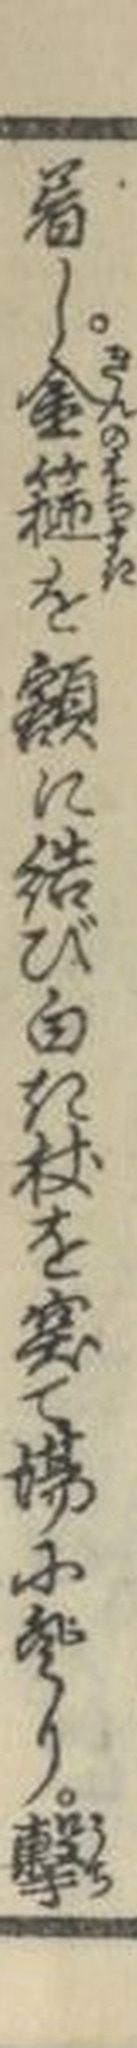着し。金箍を額に結び白き杖を突て場に登り。撃
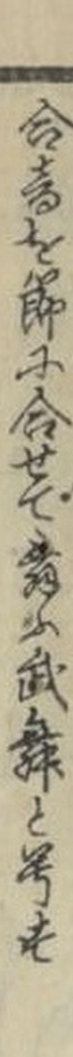合音を節に合せて舞ふ武舞と号す
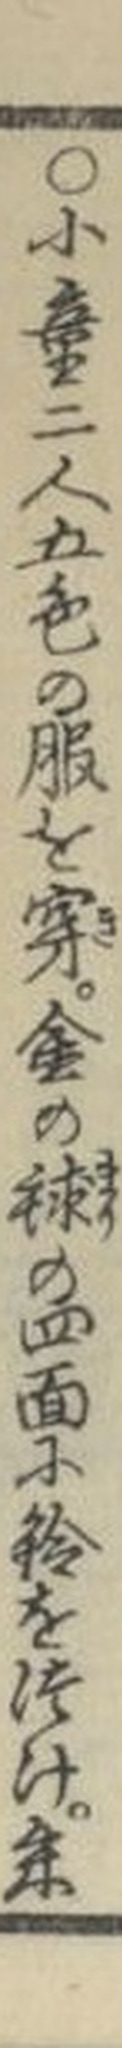○小童二人五色の服を穿。金の毬の四面に鈴をつけ。朱
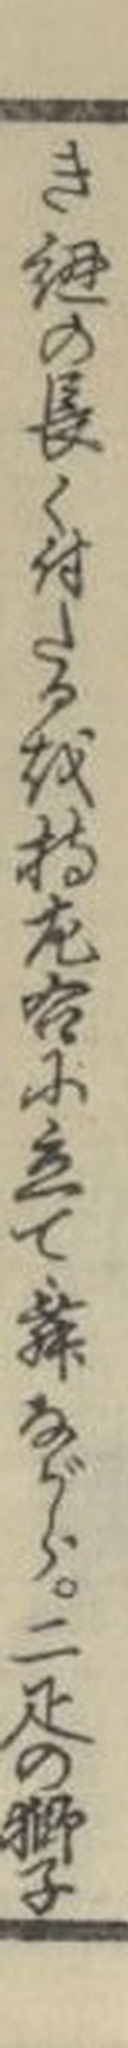き紐の長く付たるを持左右に立て舞ながら。二疋の獅子
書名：琉球解語
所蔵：University of the Ryukyus Library
